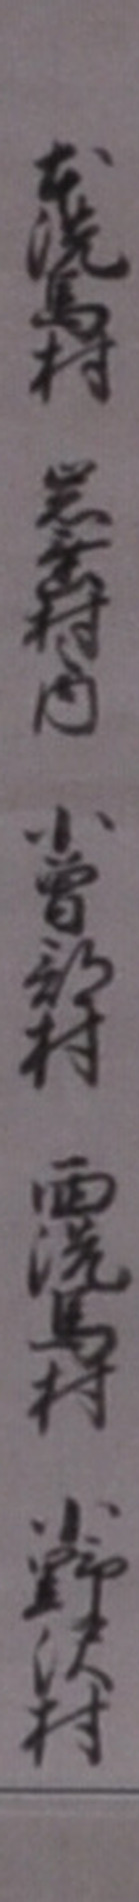本洗馬村岩垂村之内小曽部村西洗馬村小野沢村
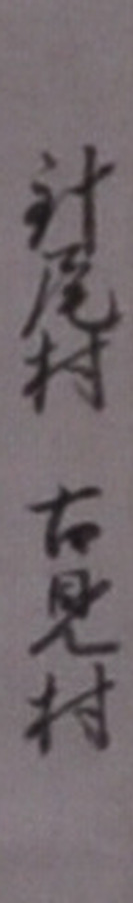針尾村古見村
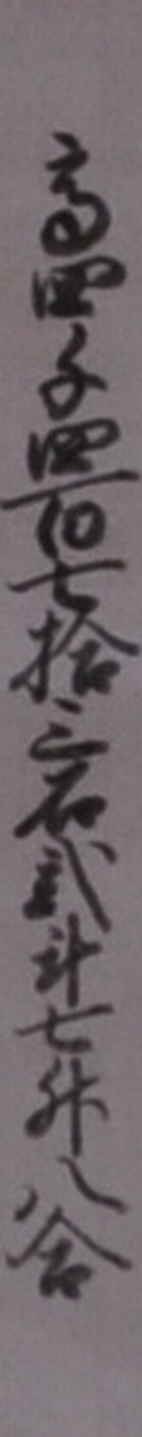高四千四百七拾三石弐斗七升八合
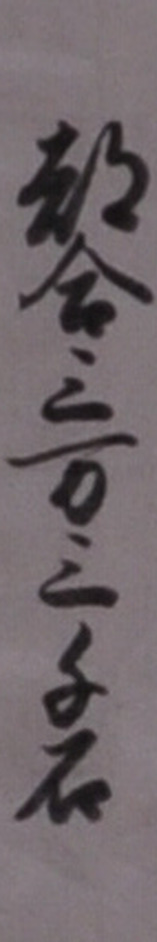都合三万三千石
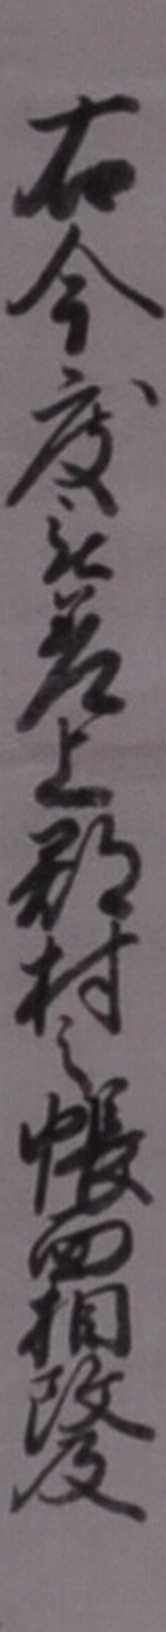右今度被差上郡村之帳面相改及
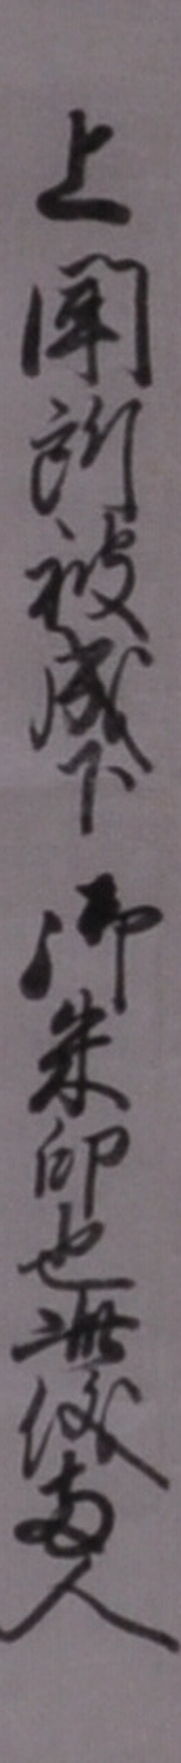上聞所被成下御朱印也此儀両人
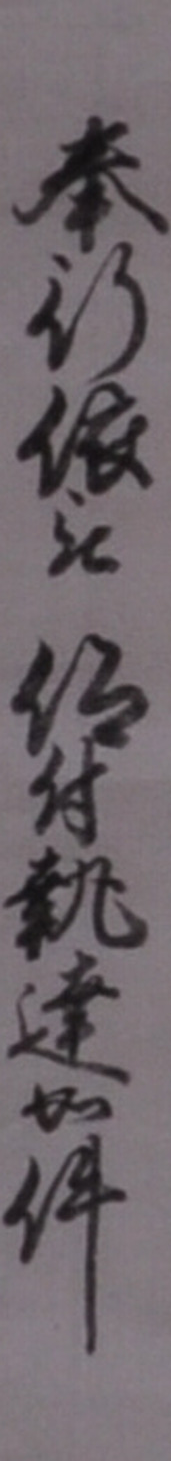奉行依被仰付執達如件
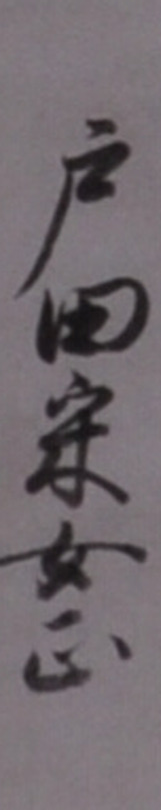戸田采女正
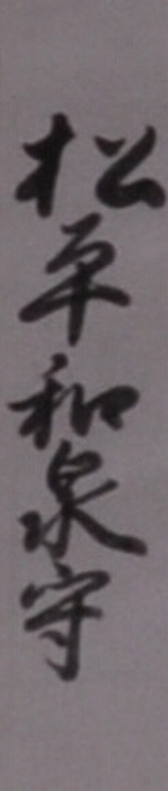松平和泉守
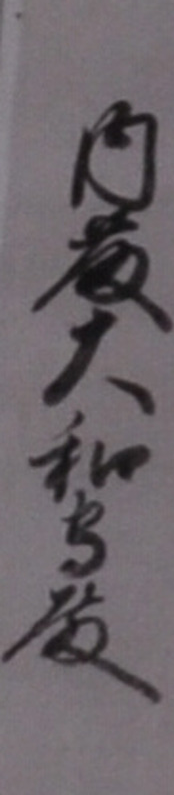内藤大和守殿
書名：御朱印写・領地目録
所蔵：伊那市立高遠町図書館・合同会社AMANE
